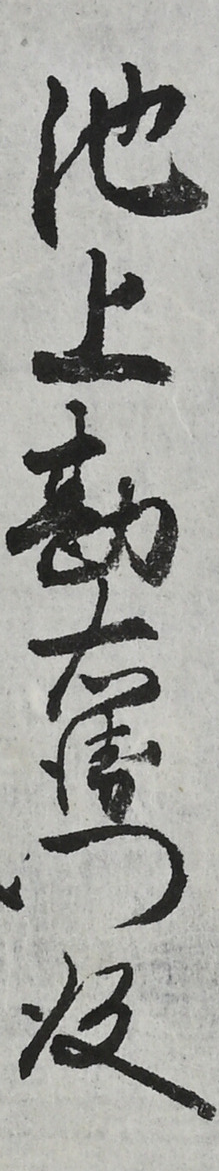池上勘右衛門殿
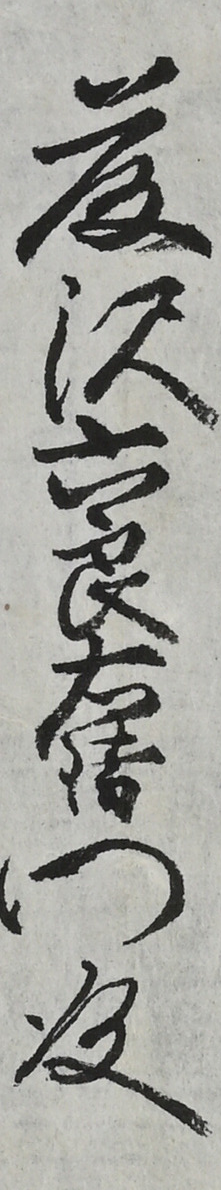藤沢六良右衛門殿
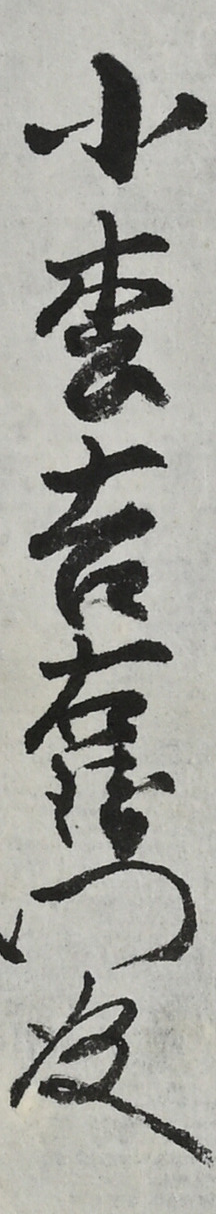小松吉右衛門殿
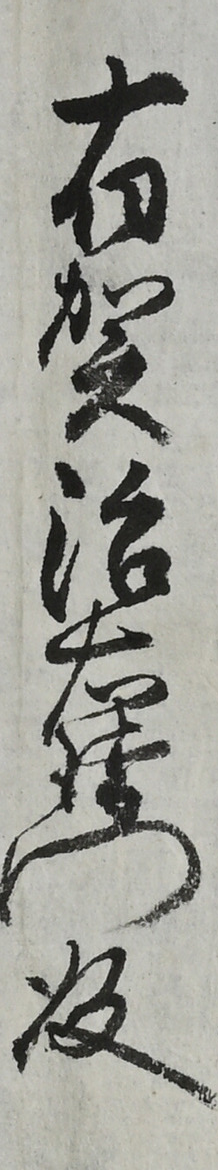有賀治右衛門殿
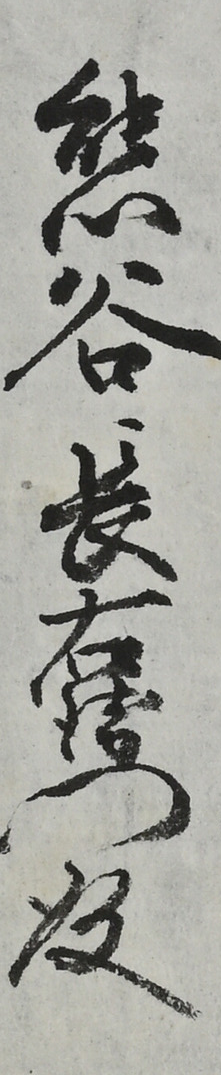熊谷長右衛門殿
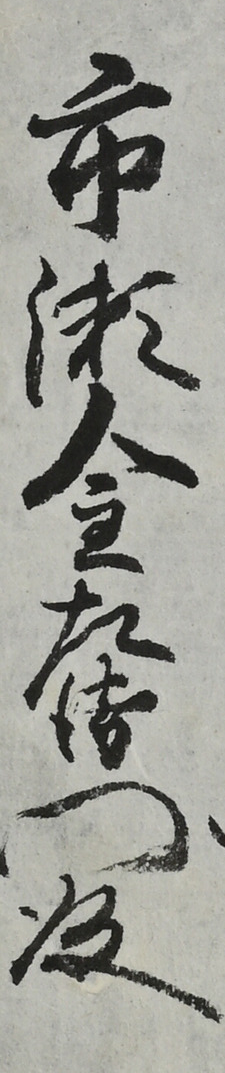市瀬金左衛門殿
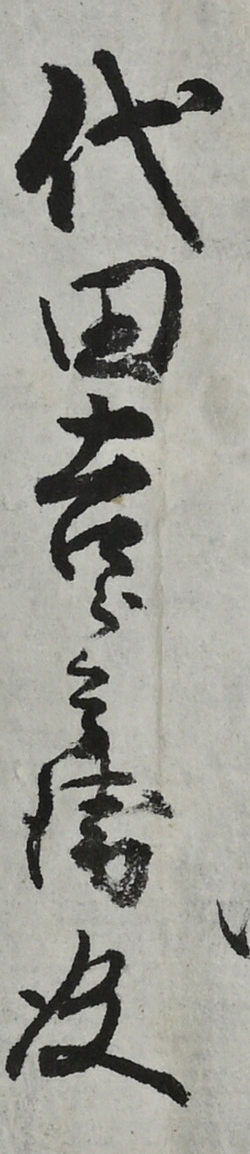代田吉郎兵衛殿
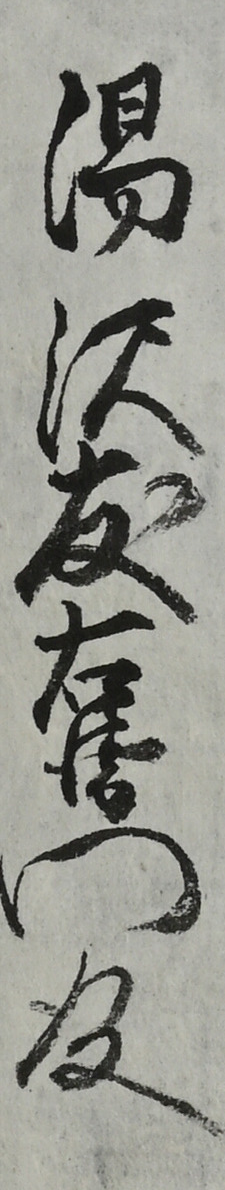湯沢友右衛門殿
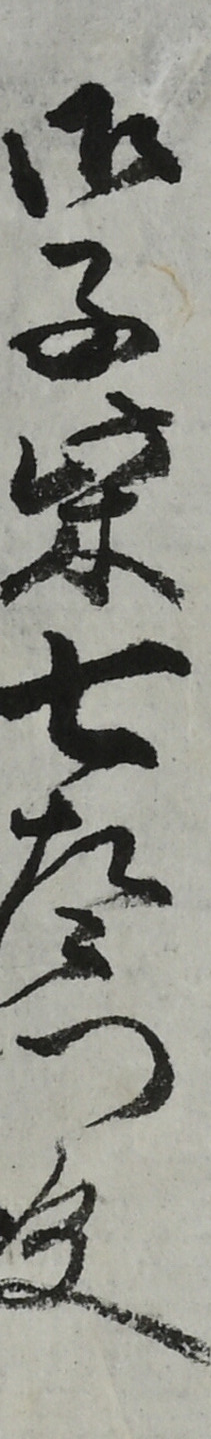御子柴七左衛門殿
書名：四本柱土俵櫓太鼓免状（写）
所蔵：伊那市立高遠町図書館・合同会社AMANE
